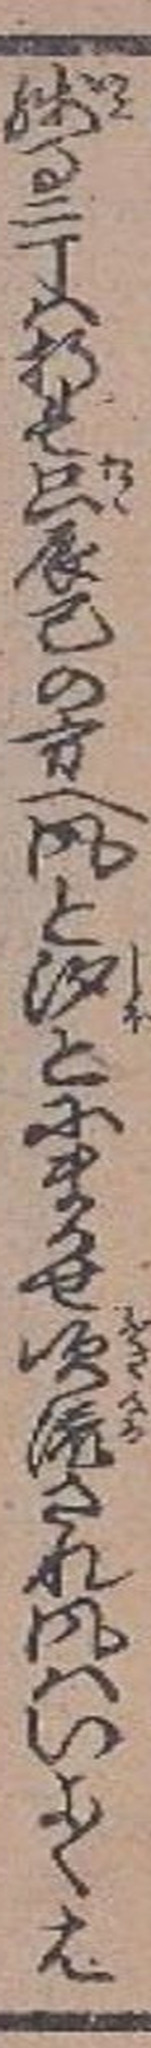残る二丁は折れ只辰巳の方へ風と汐とにまかせ吹流され風はいよ〳〵は

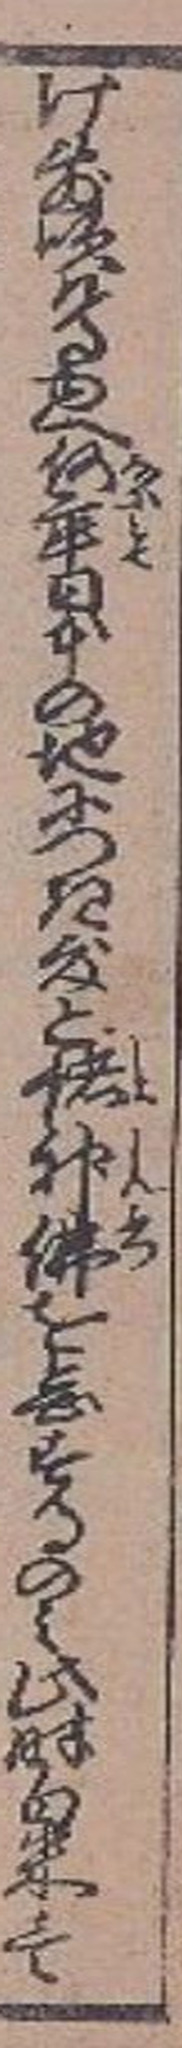け敷吹けるゆへ何卒日本の地につき度と諸神仏を念するのみ此時白米壱
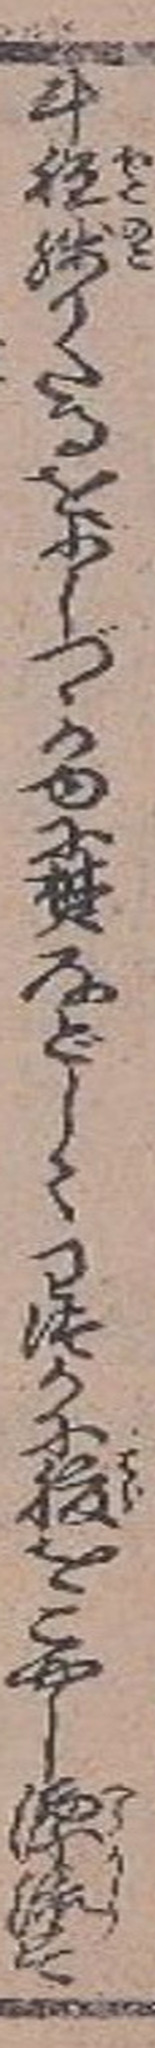斗程残りたるを少しづゝかゆに焚などしてわつかに腹をこやし漂流す
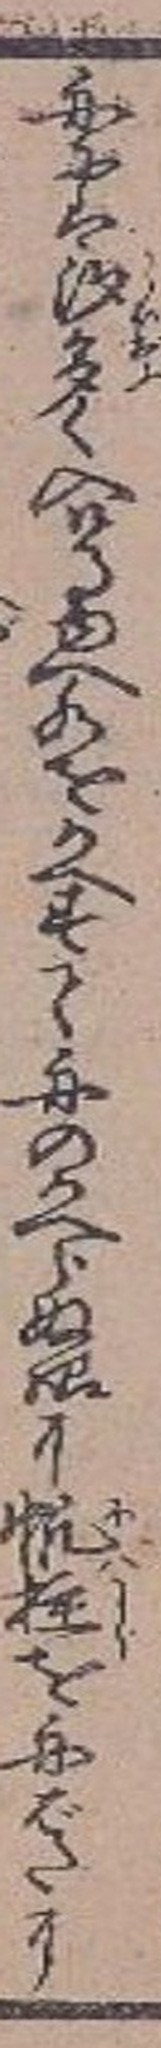舟には汐多く入けるゆへ水をかへすて舟のかへらぬ様に帆柱を舟ばたに
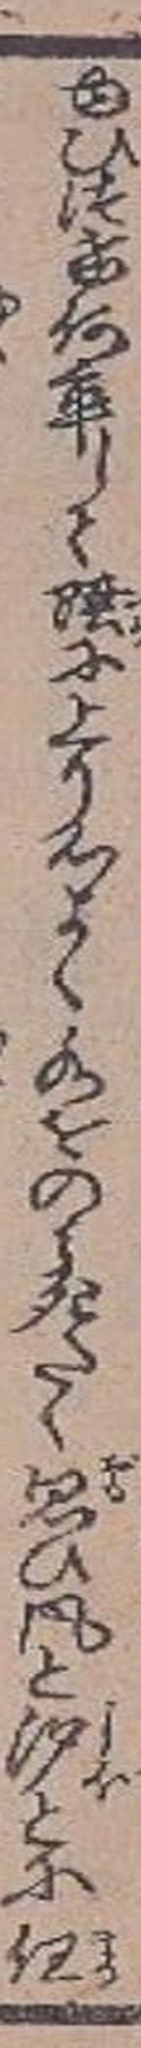ゆひつけ何卒？して陸？に上り心？よく水をのみ死たく思ひ風と汐とに任
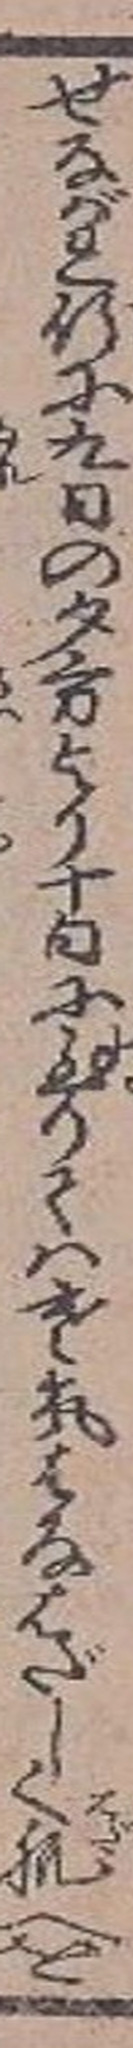せながれ行に九日の夕方より十日に至りては寒気はなはだしく肌へを
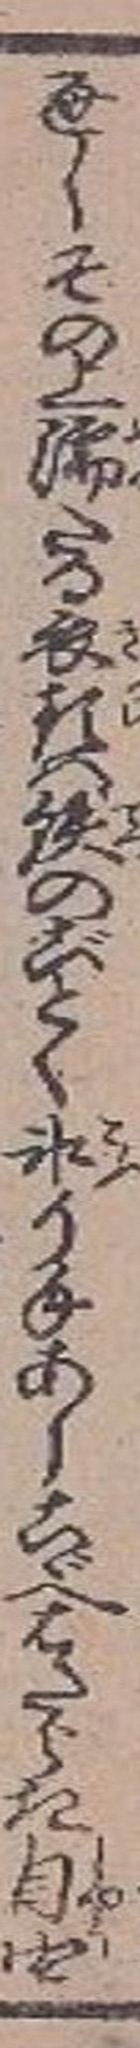通しその上濡たる衣類は鉄のごとく氷り手あしこゞへはたらき自由
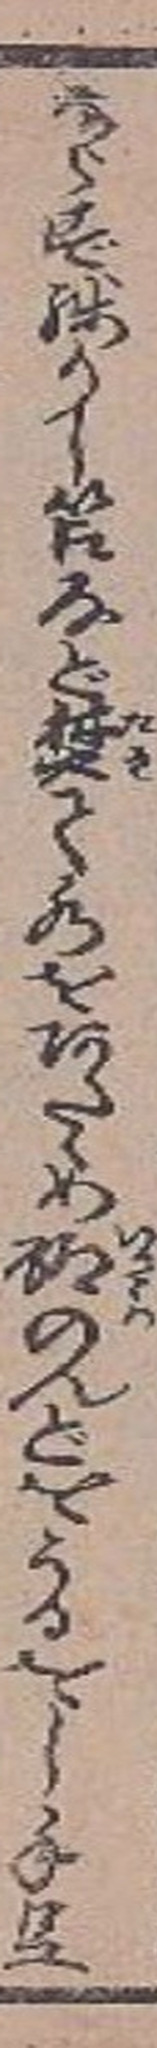ならず残りし箱など焚て水をあたゝめ聊のんどをうるをし手足
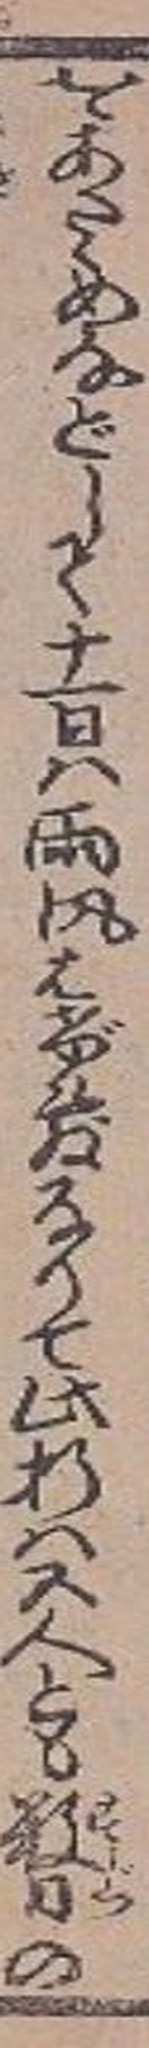をあたゝめなどして十一日は雨風はげ敷なりて此折は五人とも数日の
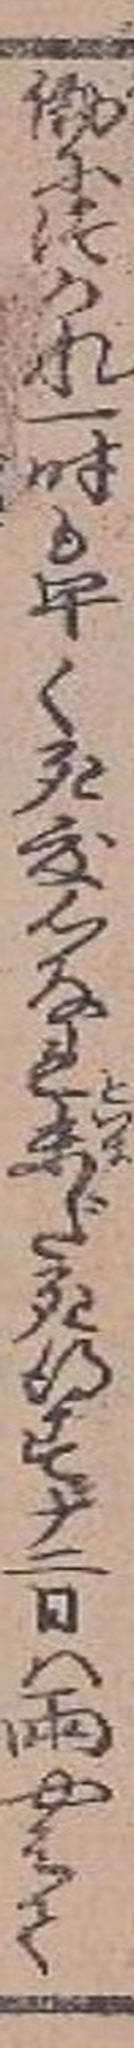働につかれ一時も早く死度心なれ未だ死得す十二日は雨やみて
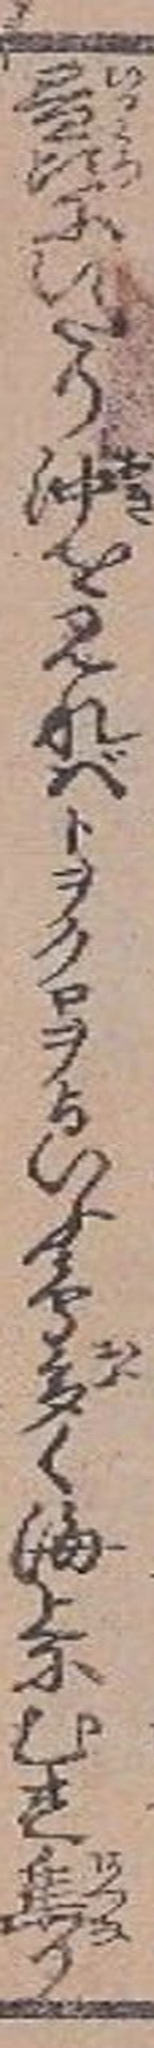昼頃にいたり沖を見ればトヲクロヲといふ鳥多く海上にむれ集り
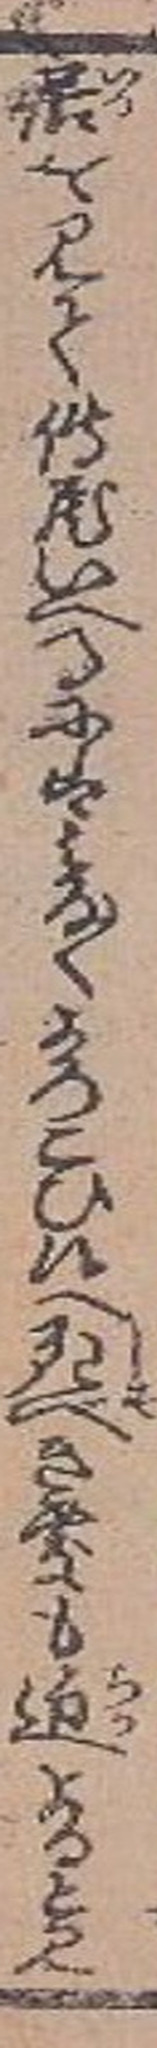居を見て伝蔵いへるにはみな〳〵よろこひ候へ死べき処も近よると見
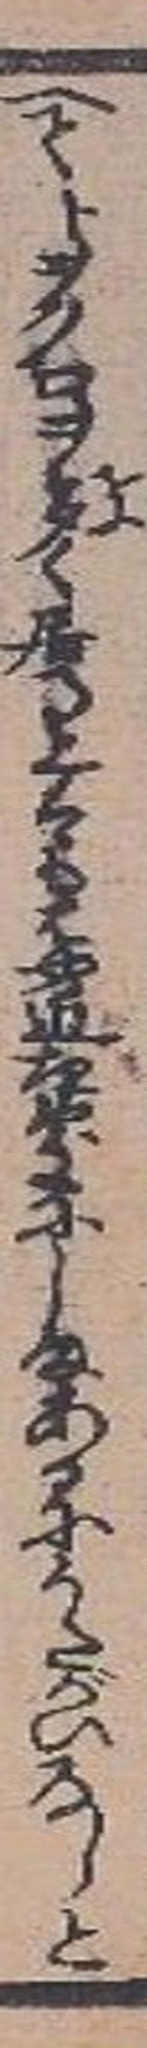へてトヲクロヲ多く居る上はもはや近き処にしまあるにうたがひなしと
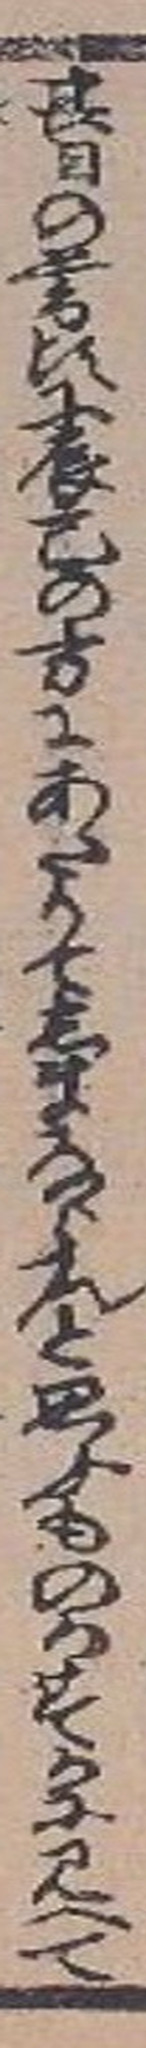其日の暮頃に辰巳の方にあたりてしまならんと思ふものかすかに見へて
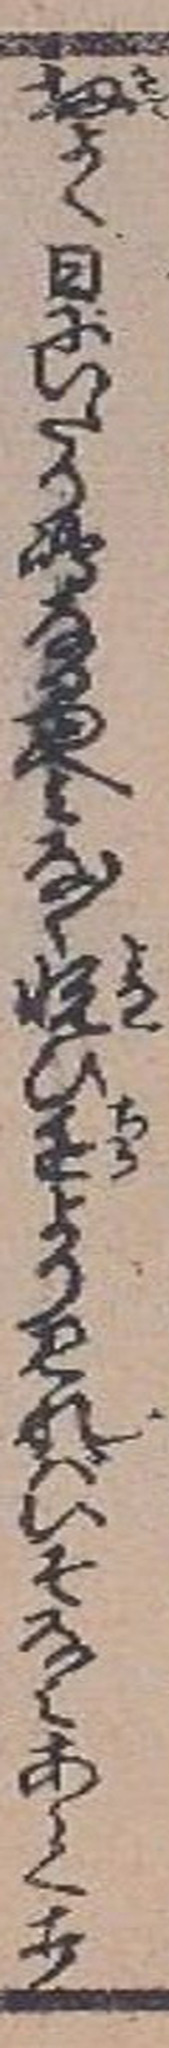扨よく日にいたり嶋なるゆへみな〳〵悦ひ近より見ればいそなみあらく打
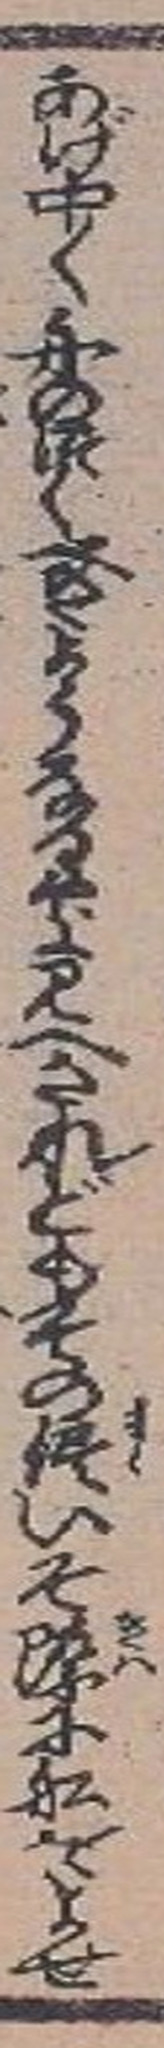あげ中〳〵舟のつくべきようなる処見へされどもその儘いそ際に船をよせ
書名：満次郎漂流記
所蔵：University of the Ryukyus Library
